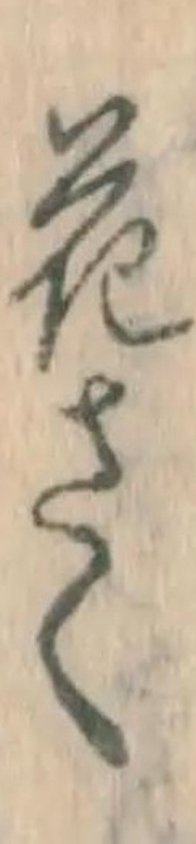花さく

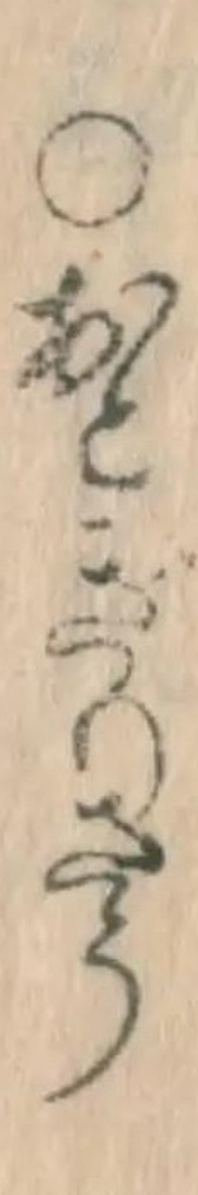〇おとぎりさう
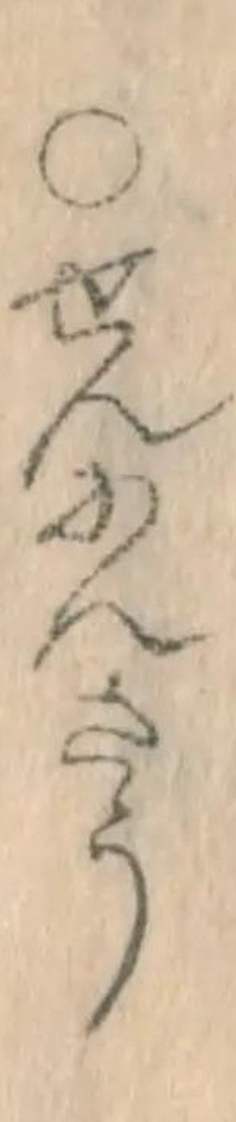〇せんにんさう
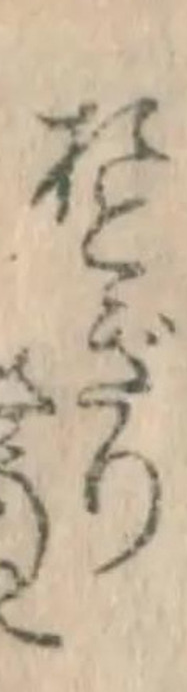おとぎり
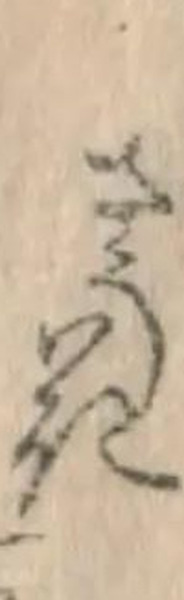さう花
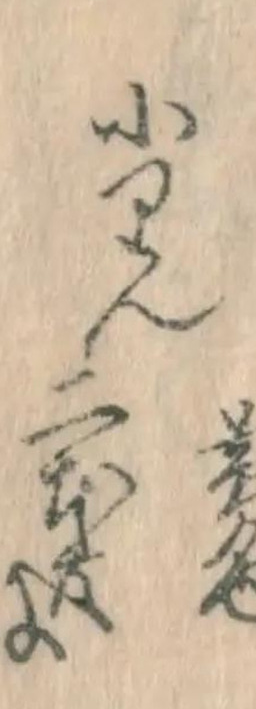小りん二本共に
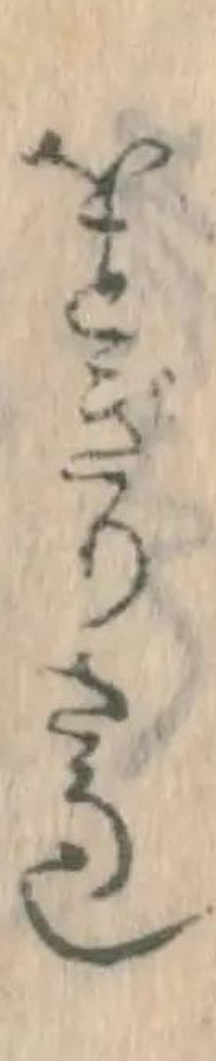をとぎりさう也
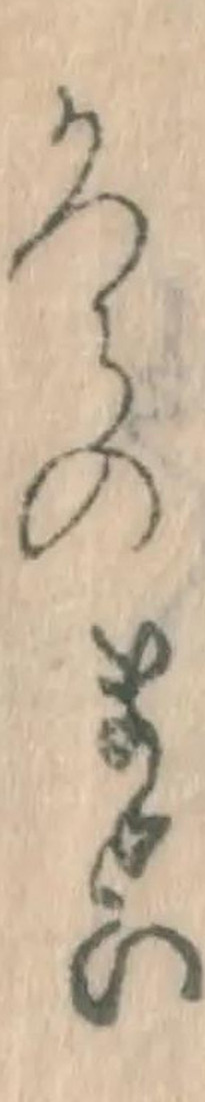かつらのまとい
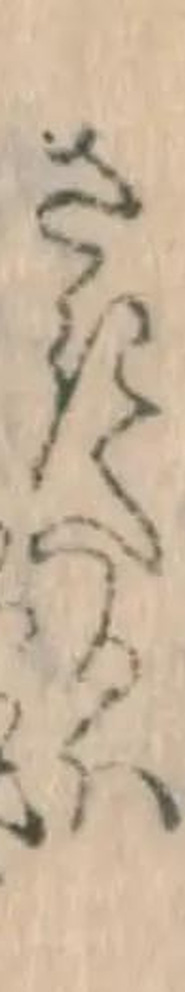さきたるは
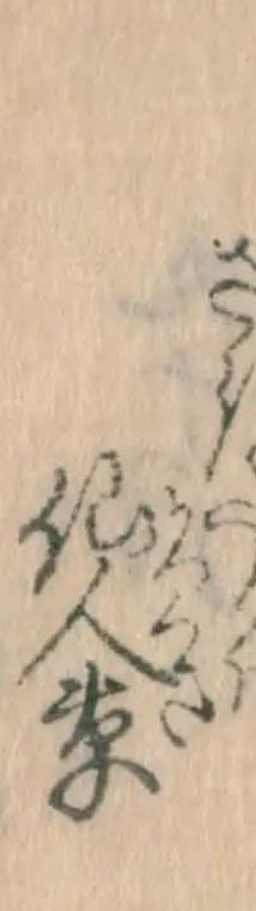仙人草
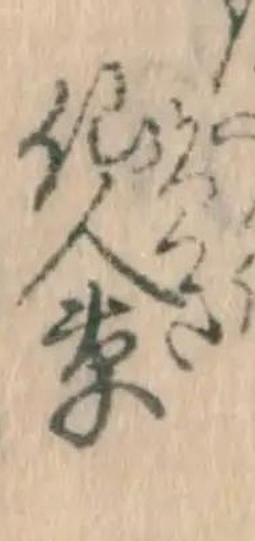仙人草
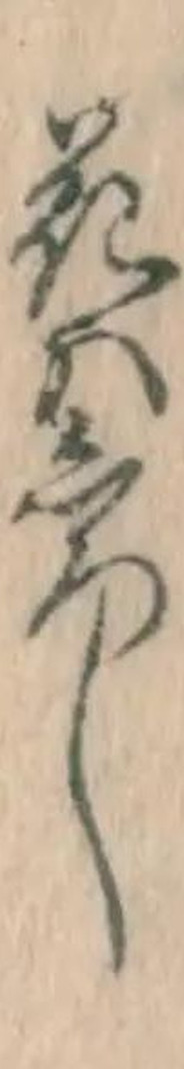花はしろく
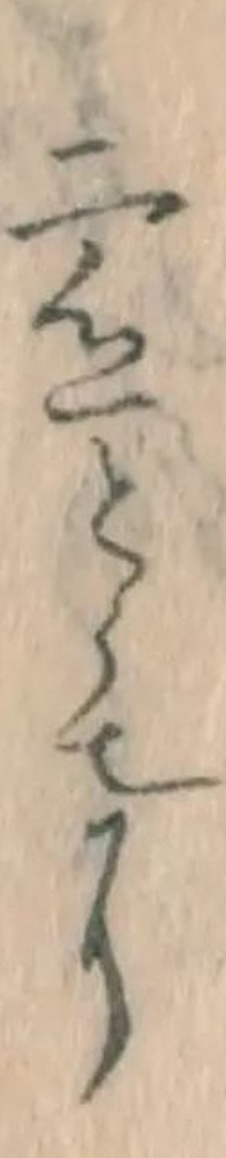二色ともに
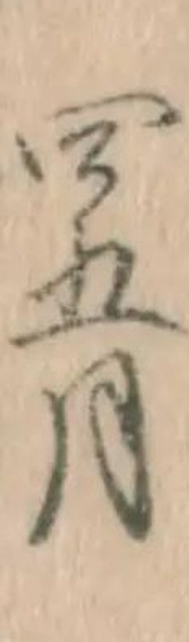四五月
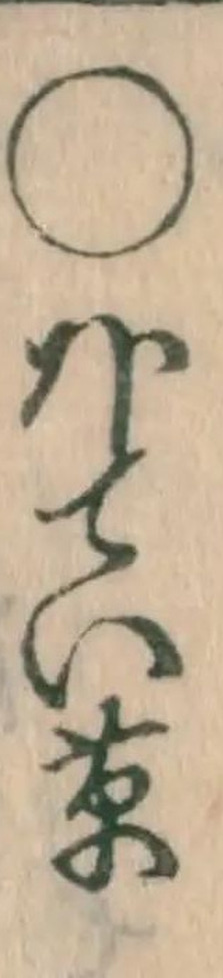〇ほてい草

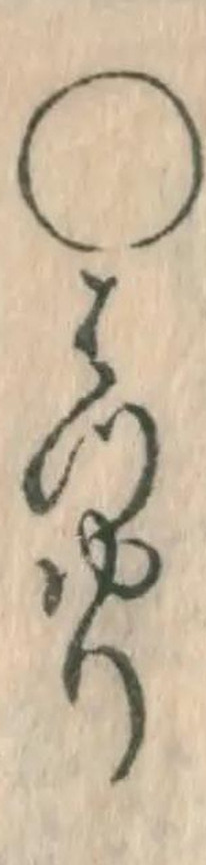〇はつゆり
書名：艸花繪前集. [1]
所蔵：国立国会図書館 National Diet Library, JAPAN
